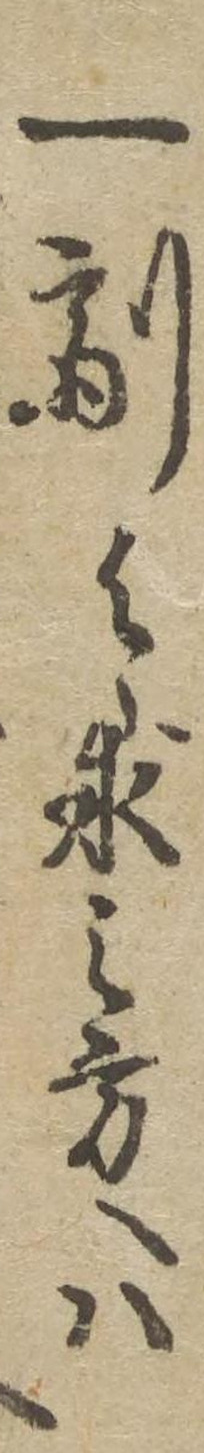一劑之求之方へは
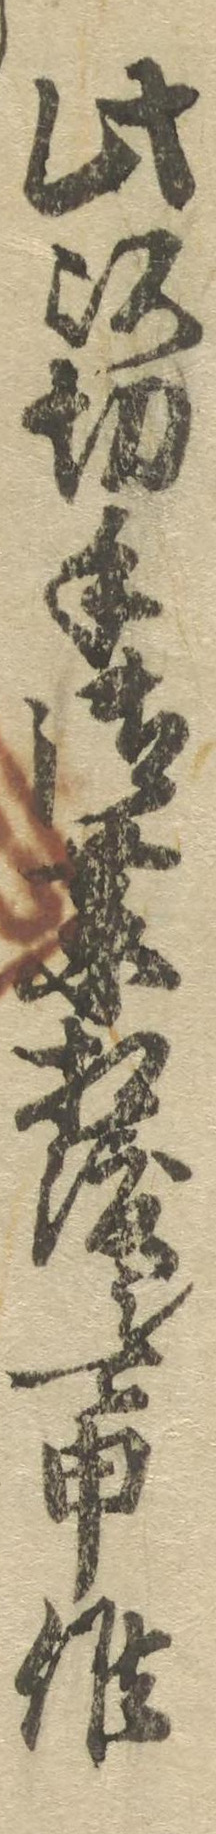此以切手御薬相渡し可申候
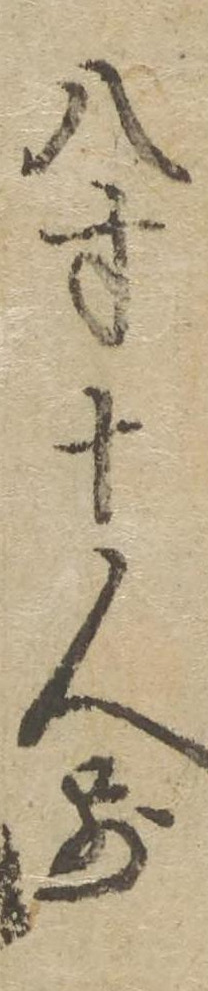八寸十人前
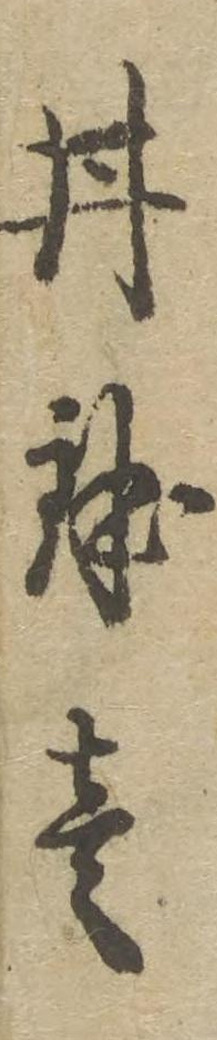丼鉢壱
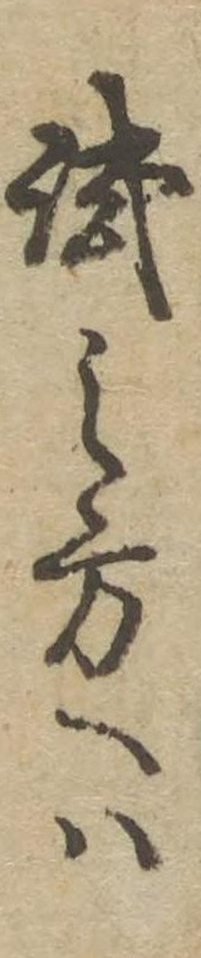試之方へは
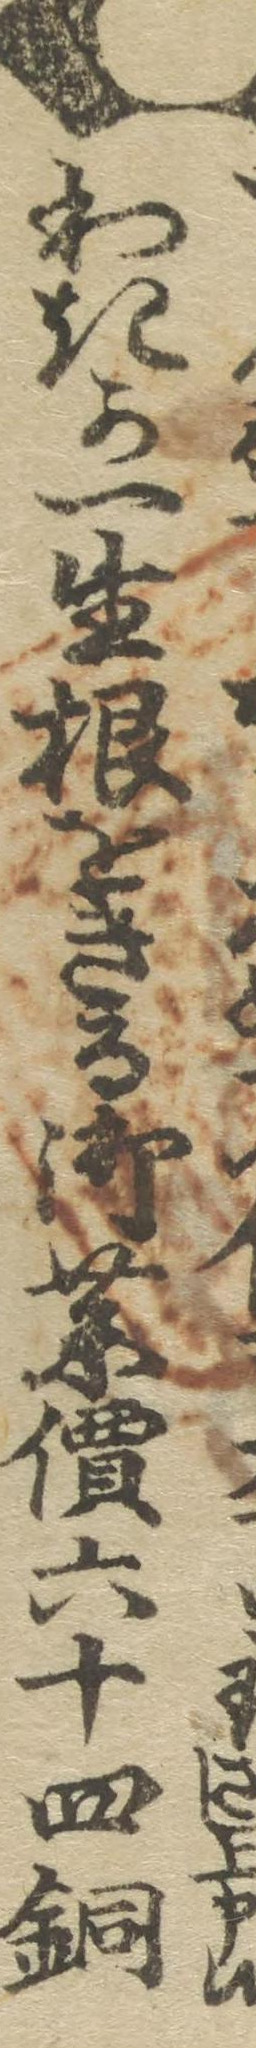わきか一生根をきる御薬価六十四銅
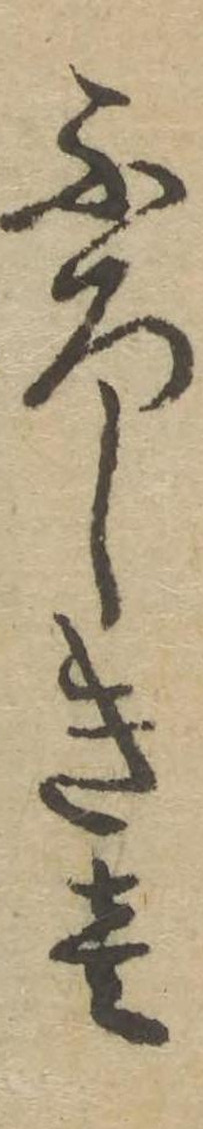ふろしき壱
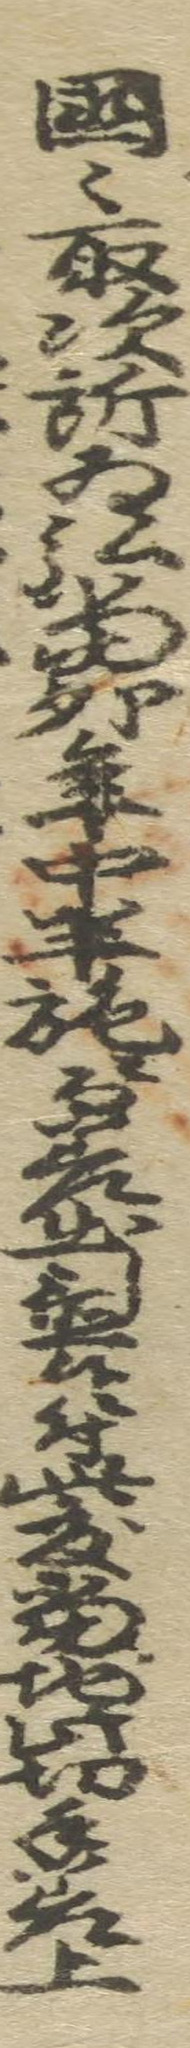国々取次所為弘当卯年中半施に而差出し置候に付此度当地此切手差上
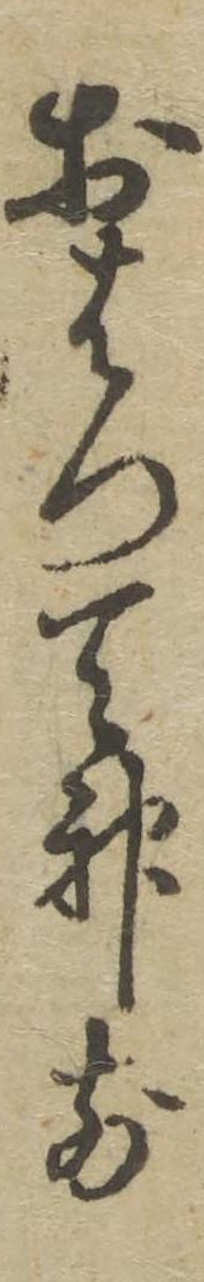おはつて神前
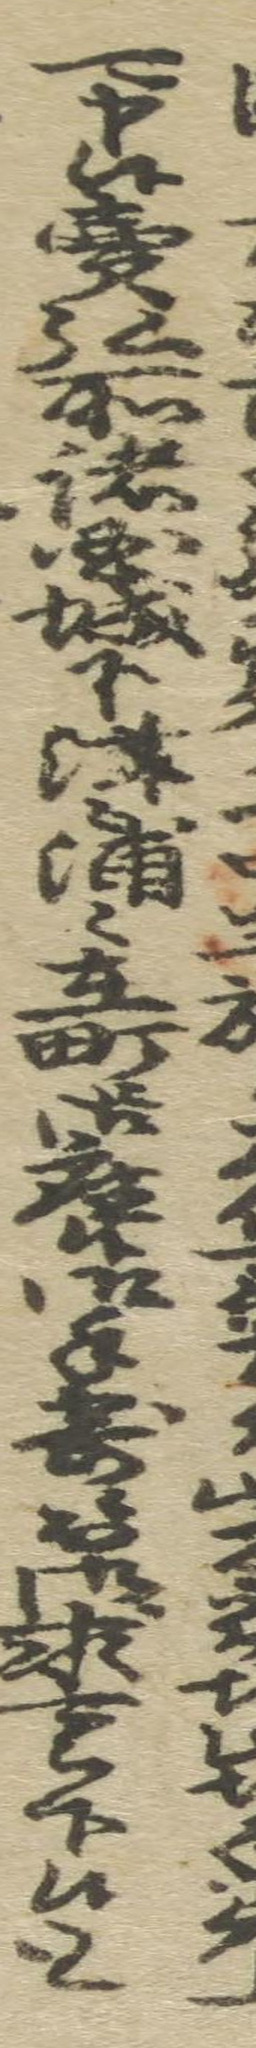可申候売弘所諸国城下津々浦々在町に御座候御手寄ニ而御求可被下候以上
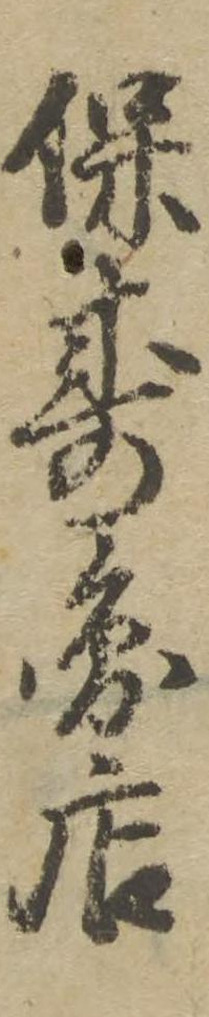保寿圓店

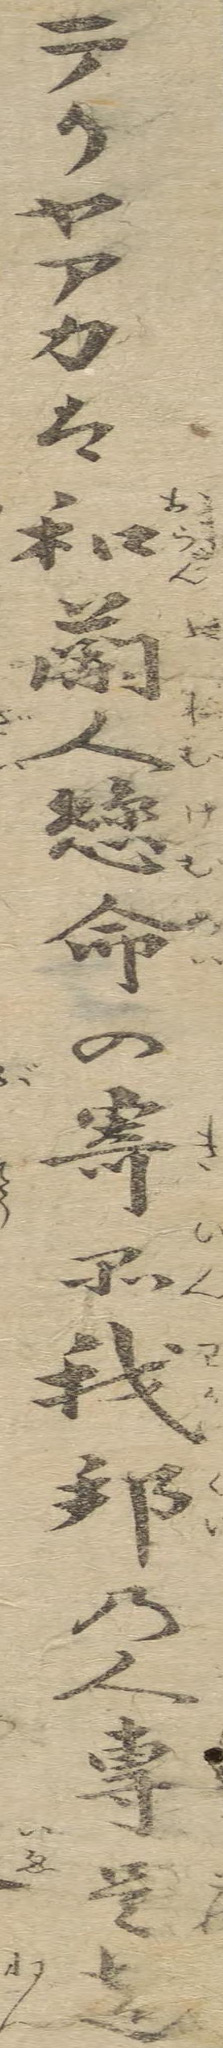テリヤアカは和蘭人懸命の寄品我邦の人専是迠
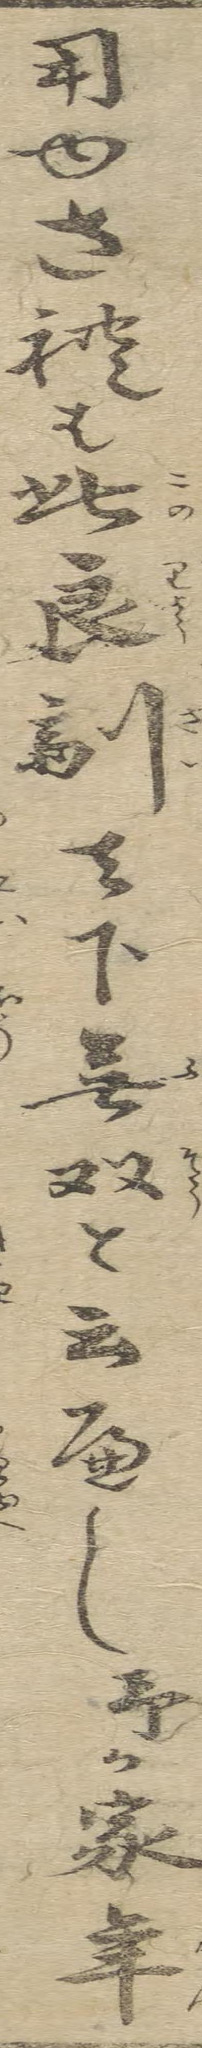用ゆされは此良劑は下無双と云へし予か家年
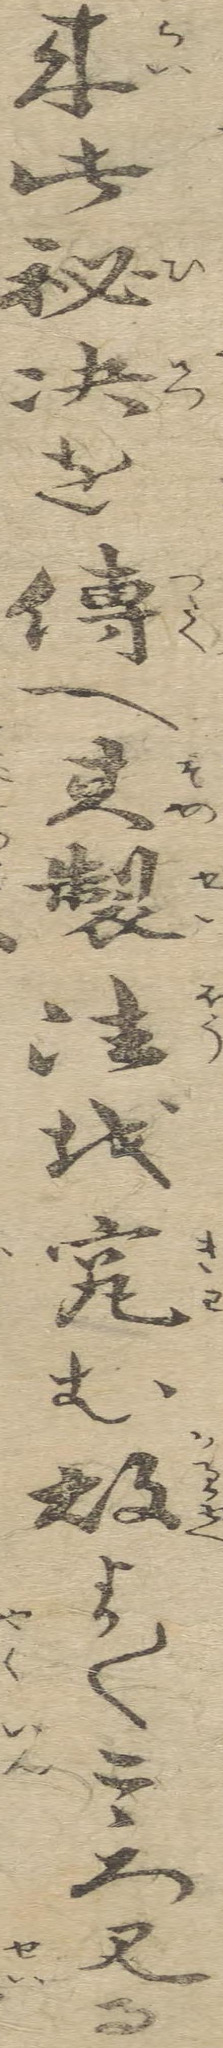来此秘決を傳へ其製法を究む故より〳〵こゝろ見る
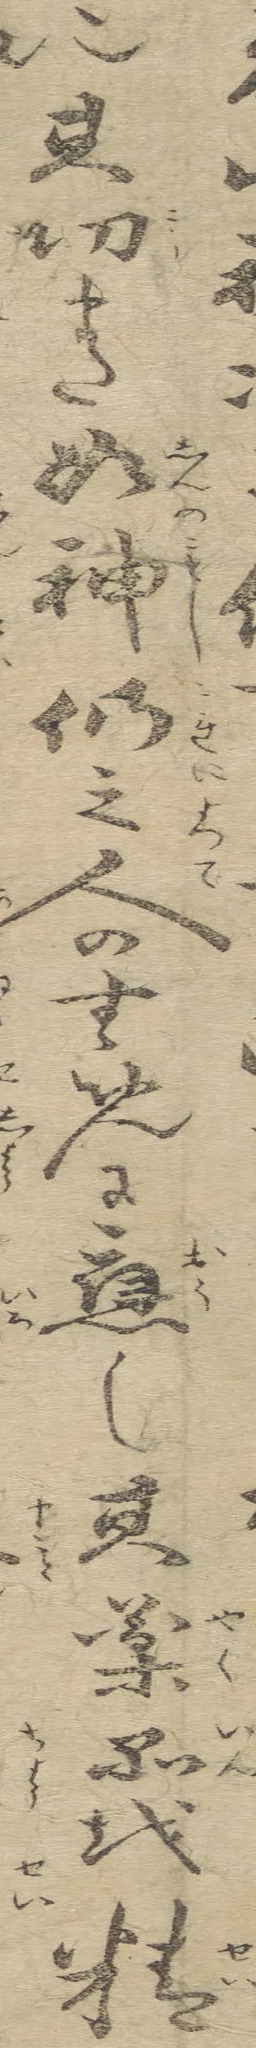に其功また如神仍之人のすゝめに応し其薬品を精
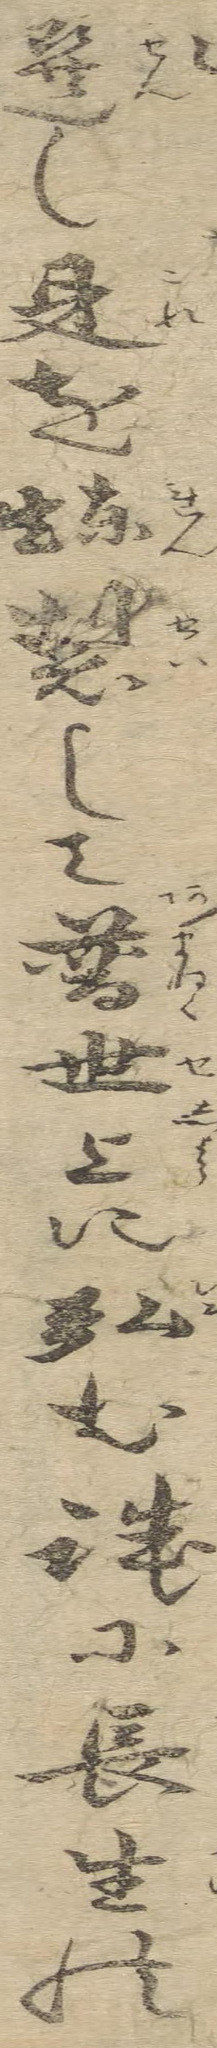選し是を練製して普世上に弘む誠に長生の
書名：浪華薬種問屋能書張交帖. 二
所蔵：国立国会図書館 National Diet Library, JAPAN
